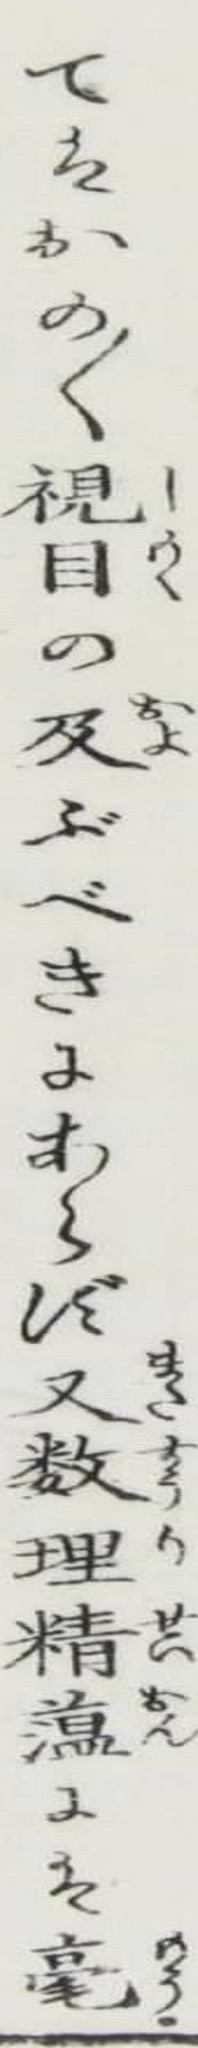てはおの〳〵視目の及ぶべきにあらず又教理精薀には毫．
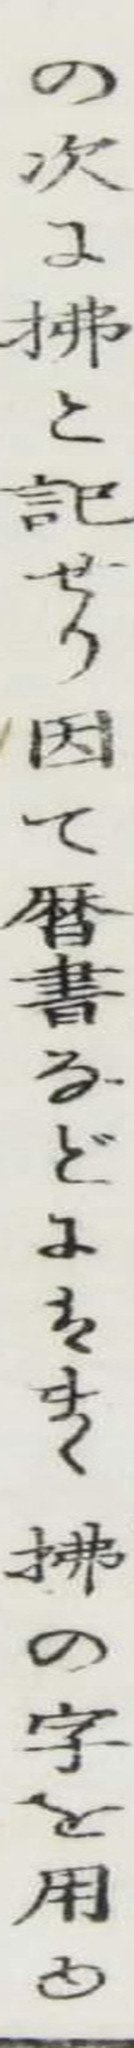の次に拂．と記せり因て暦書などにはまゝ拂の字を用ゆ
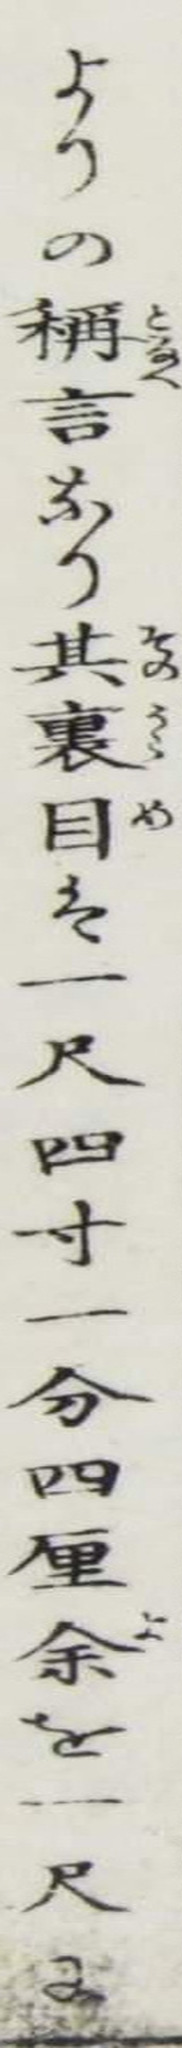よりの称言なり其裏目は一尺四寸一分四厘余を一尺に
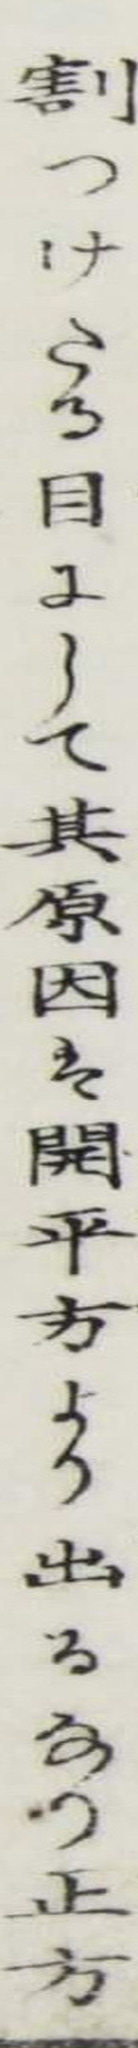割つけたる目にして其原因は開平方より出るなり正方
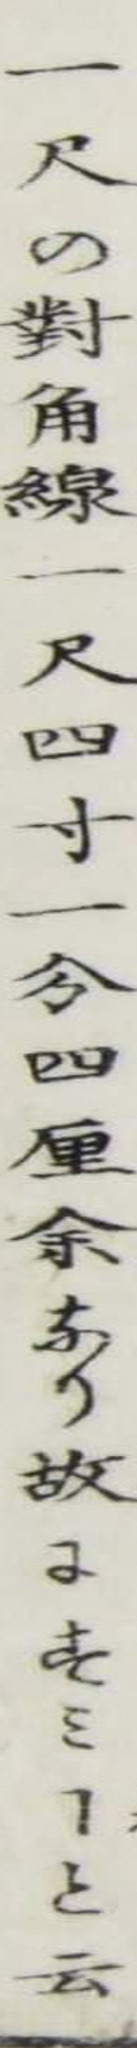一尺の対角線一尺四寸一分四厘余なり故にすみ┏と云

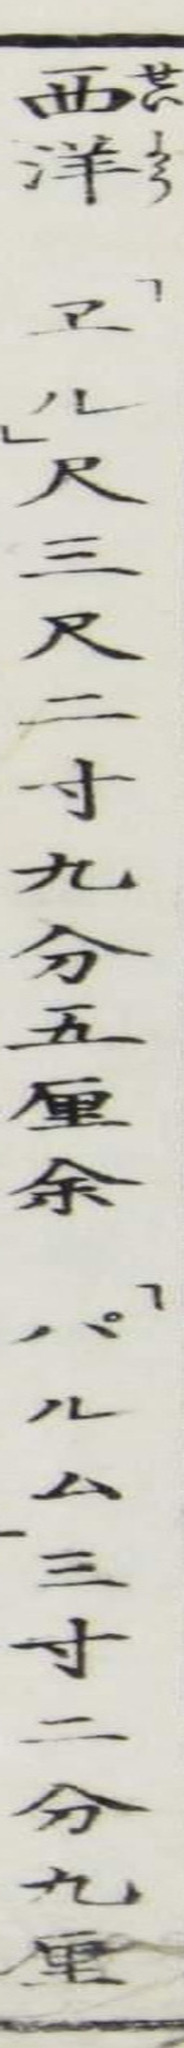西洋「ヱル」尺三尺二寸九分五厘余「パルム」三寸二分九厘
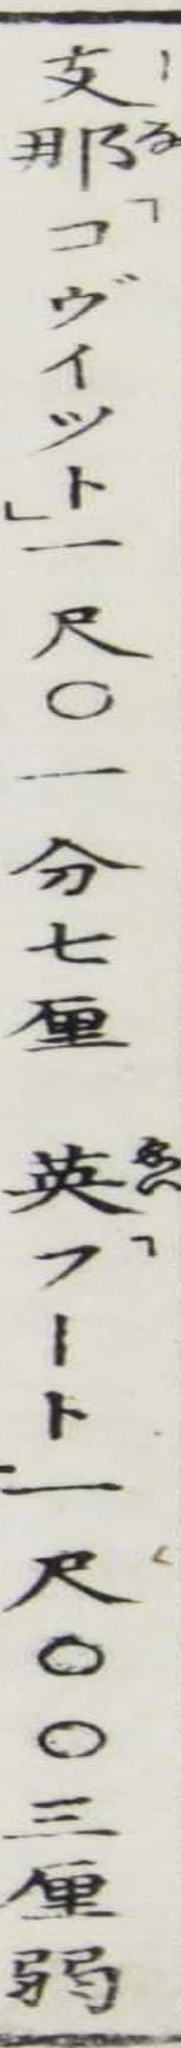支那「コヴイツト」一尺〇一分七厘英「フート」一尺〇〇三厘弱

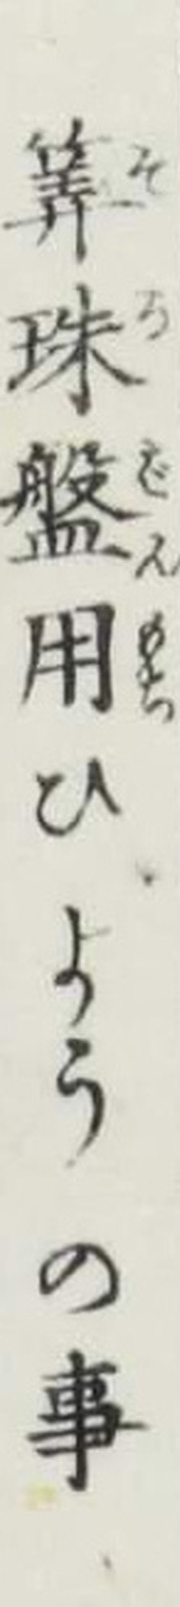算珠盤用ひようの事
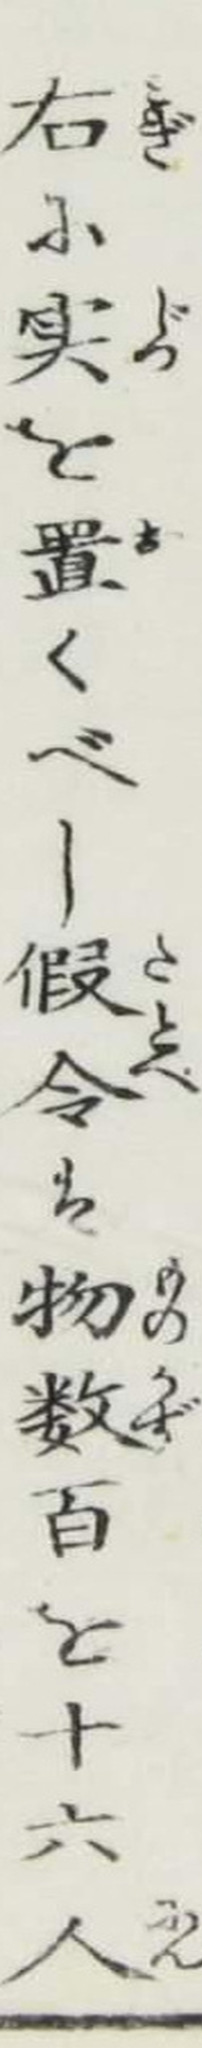右に実を置くべし仮令は物数百を十六人
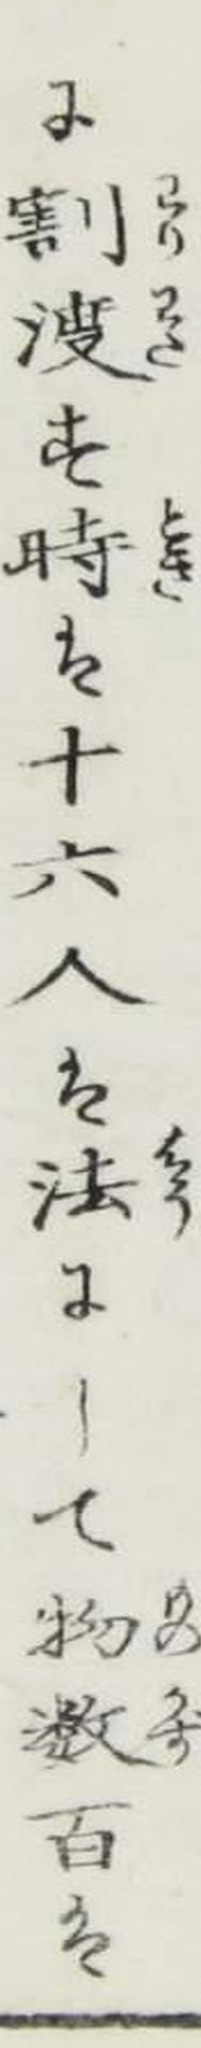に割渡す時は十六人は法にして物数百は
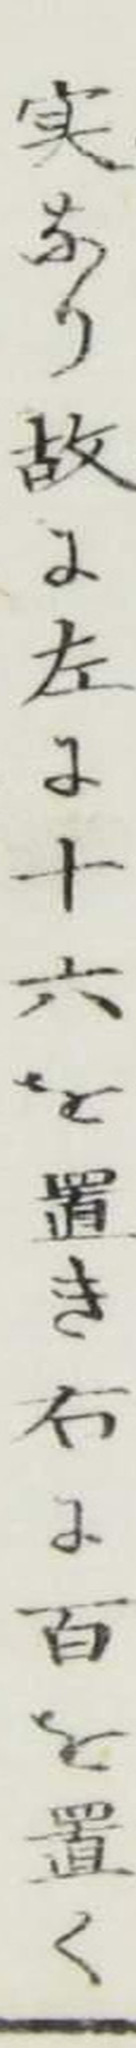実なり故に左に十六を置き右に百を置く
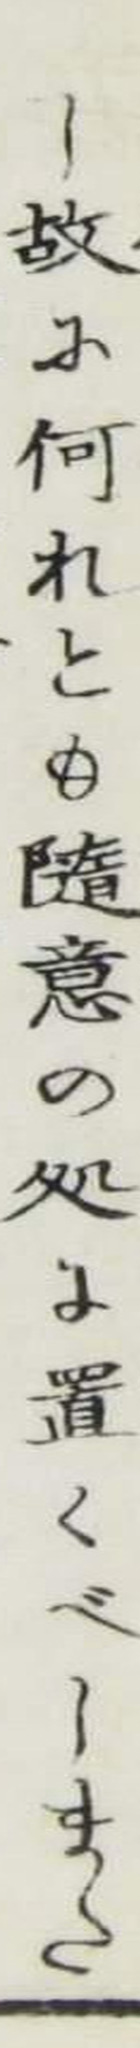し故に何れとも随意の処に置くべしまた
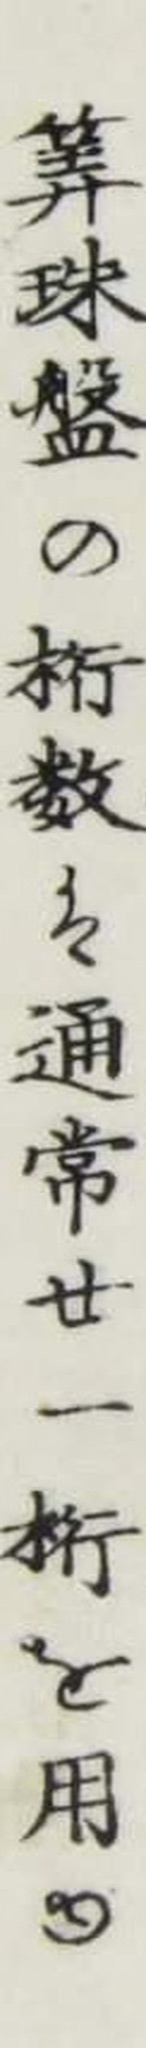算珠盤の桁数は通常廿一桁を用ゆ
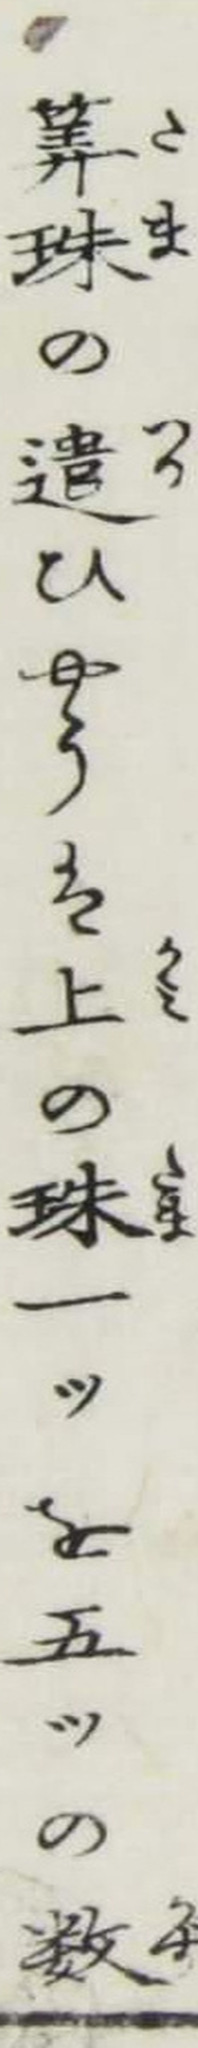算珠の遣ひやうは上の珠一ッを五ッの数
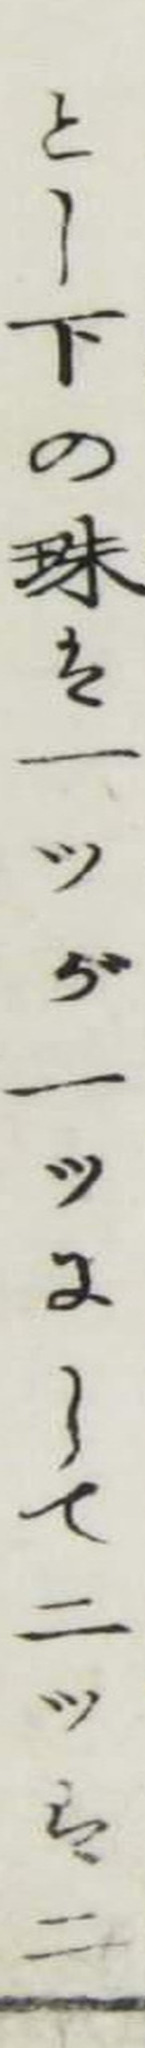とし下の珠は一ッが一ッにして二ッは二
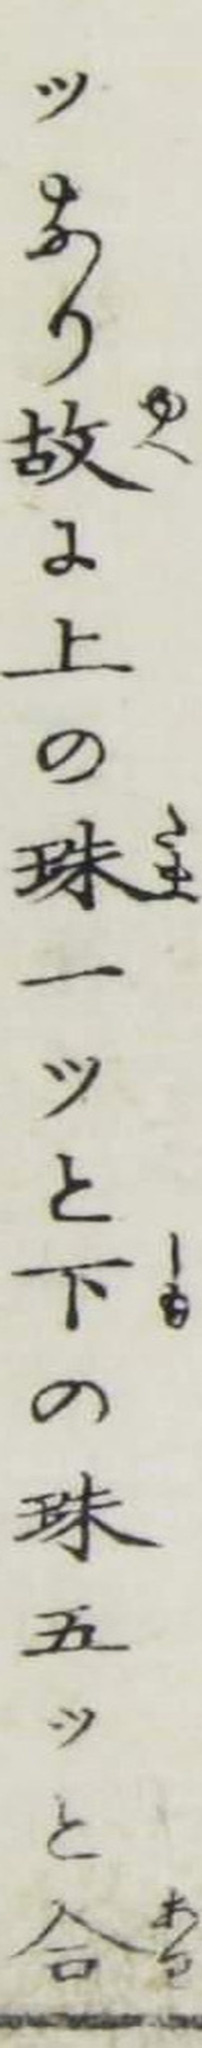ッなり故に上の珠一ッと下の珠五ッと合
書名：明治小學塵劫記 卷1
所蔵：東京学芸大学教育コンテンツアーカイブ
